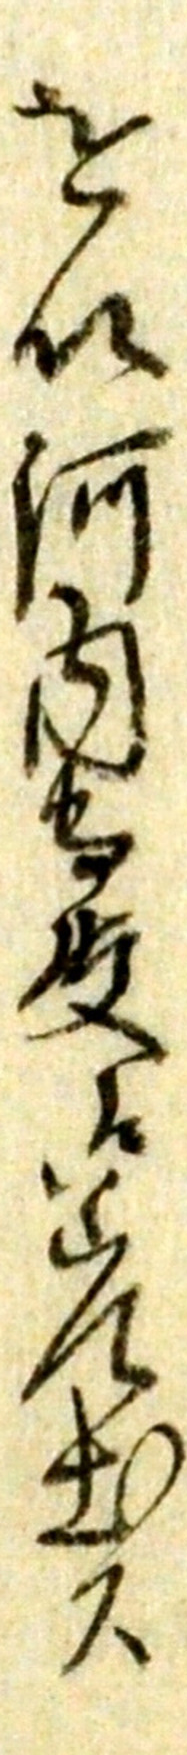を以河内守殿江差出ス
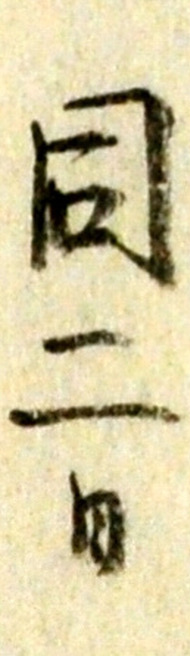同二日
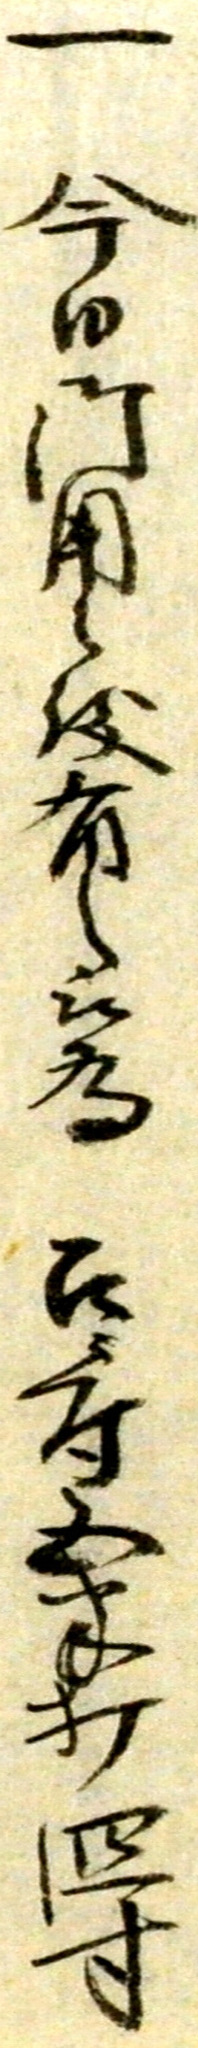一今日御用之儀有之被為召ニ付五半打四寸
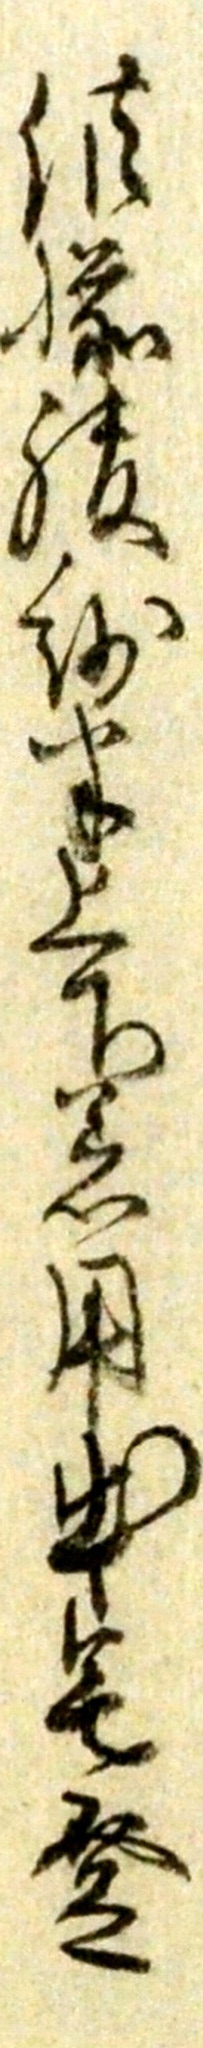供揃服紗半上下着用出宅登
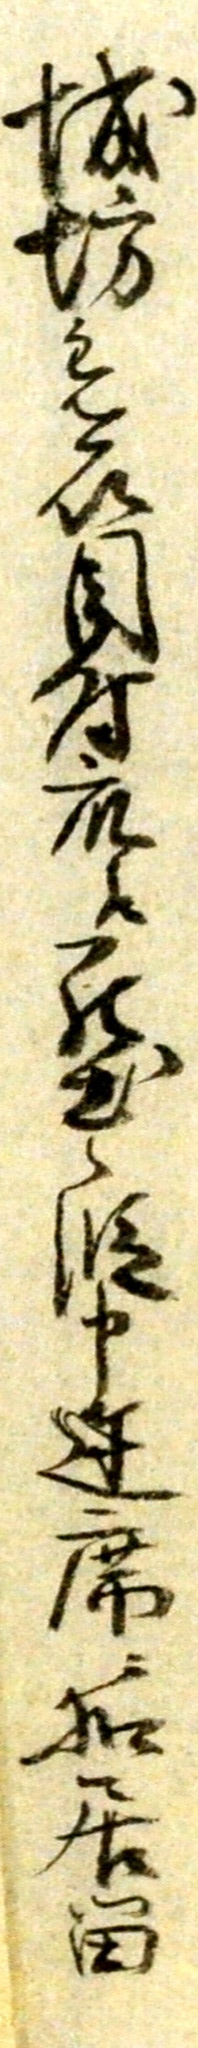城坊主者御目付衆江罷出候段申達席ニ扣居

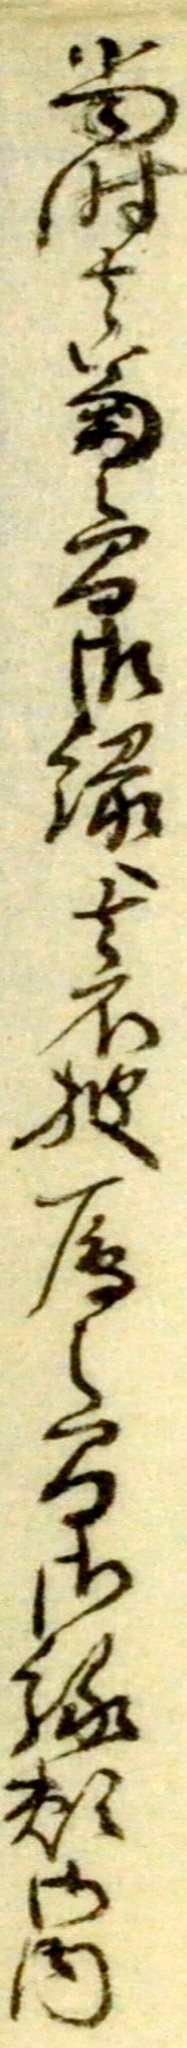当時者菊之間御縁へ者不披雁之間御縁頬御内
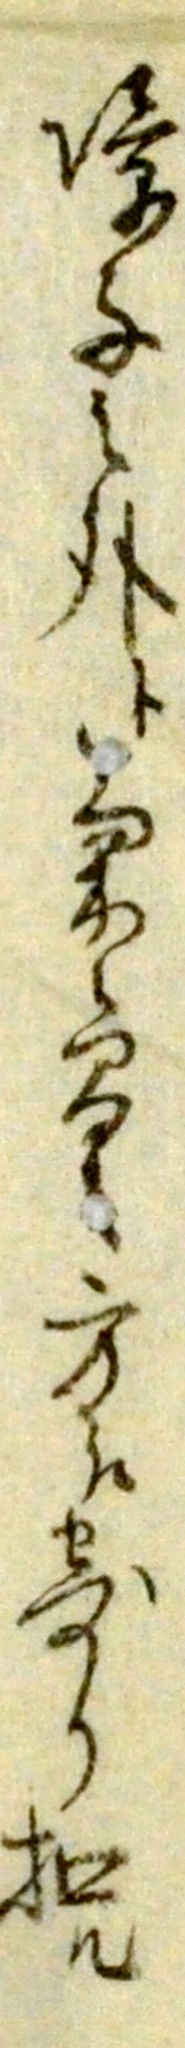障子之外ト菊之間之方江寄り扣ル

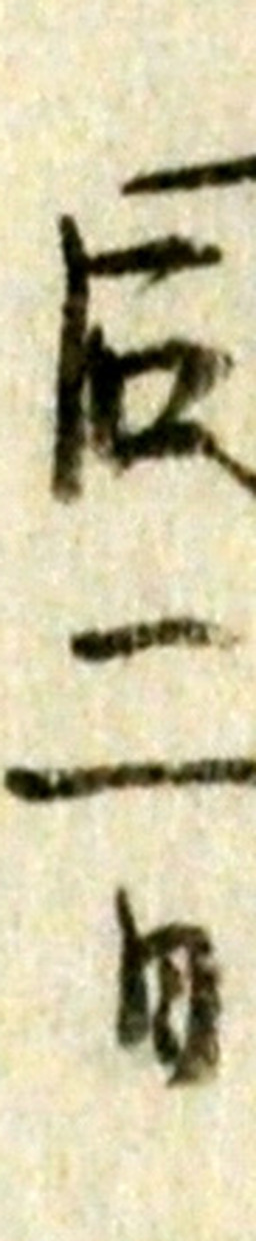同二日
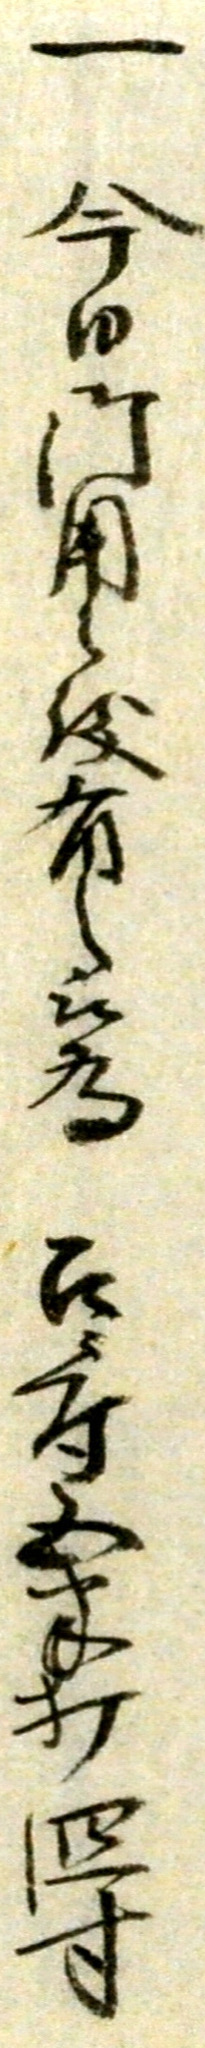一今日御用之儀有之被為召ニ付五半時四寸
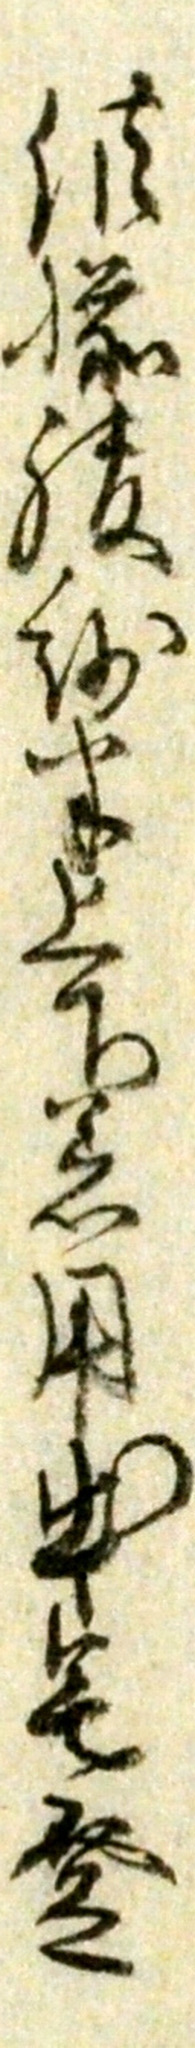供揃服紗半上下着用出宅登
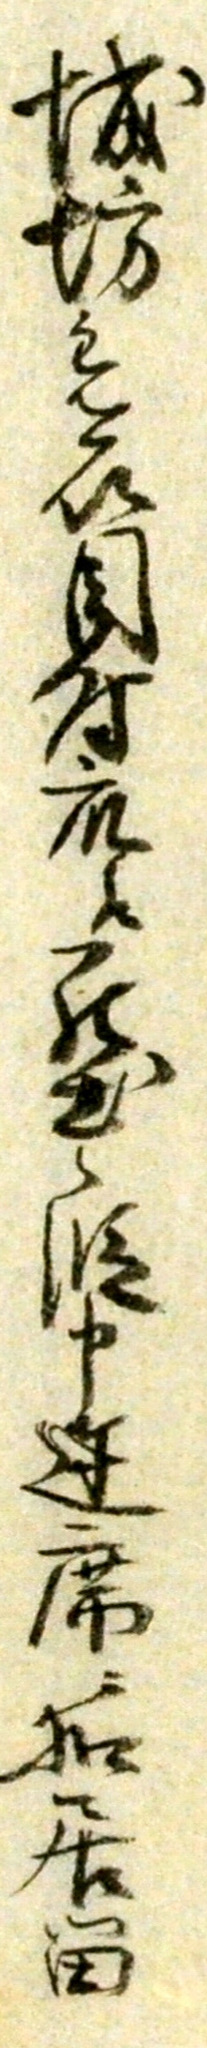城坊主者以目付衆被罷出候段申達席ニ扣居留
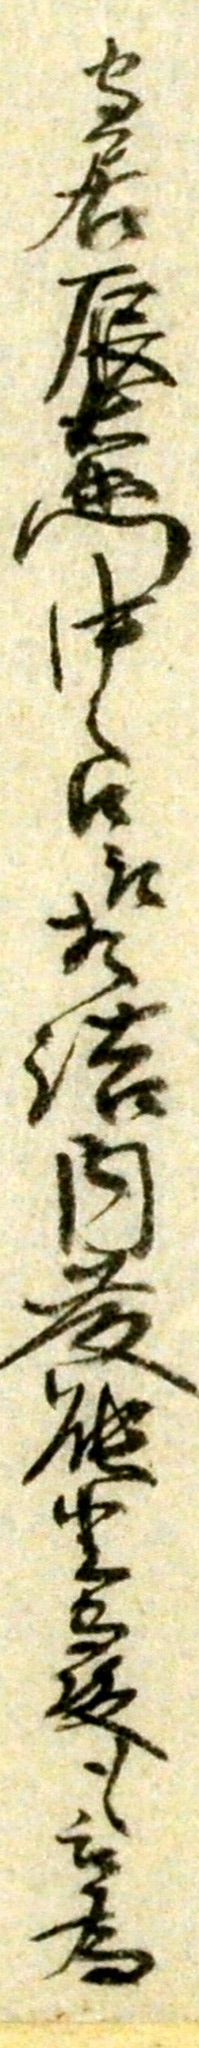守居辰右衛門中之口江相詰内藤能登守殿も被為
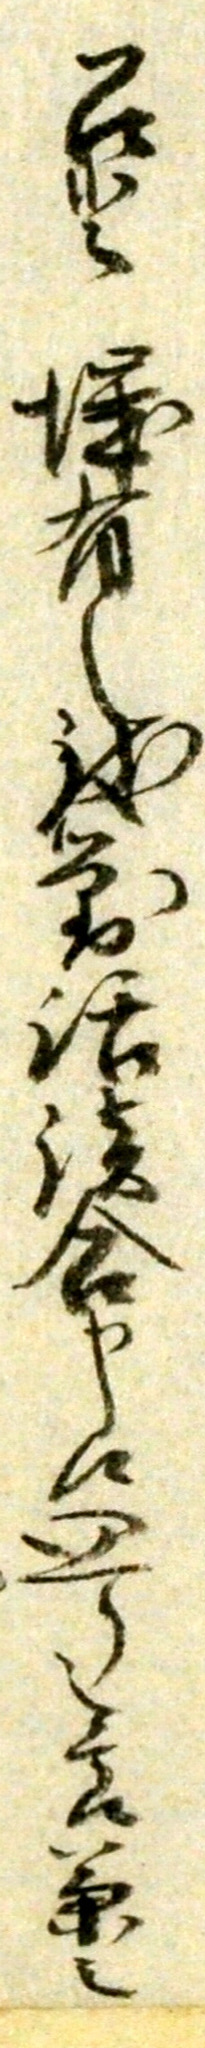召登城有之致對話談合申候廻り之節菊之
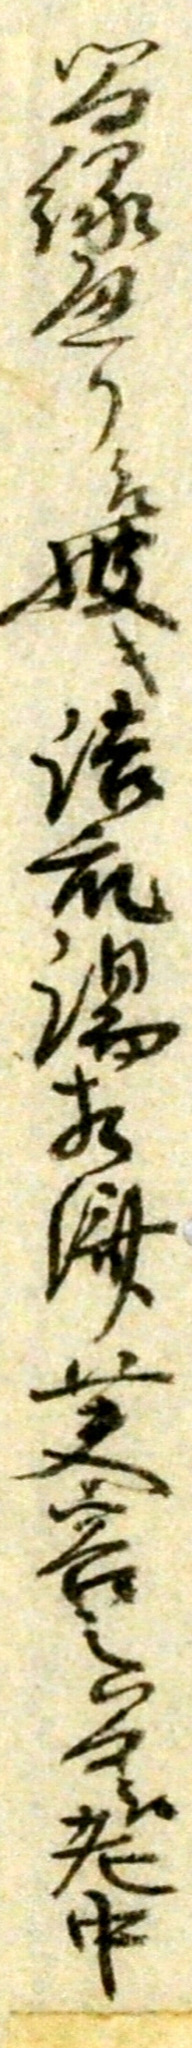間縁通り被披キ詰衆謁相済芙蓉之間江老中
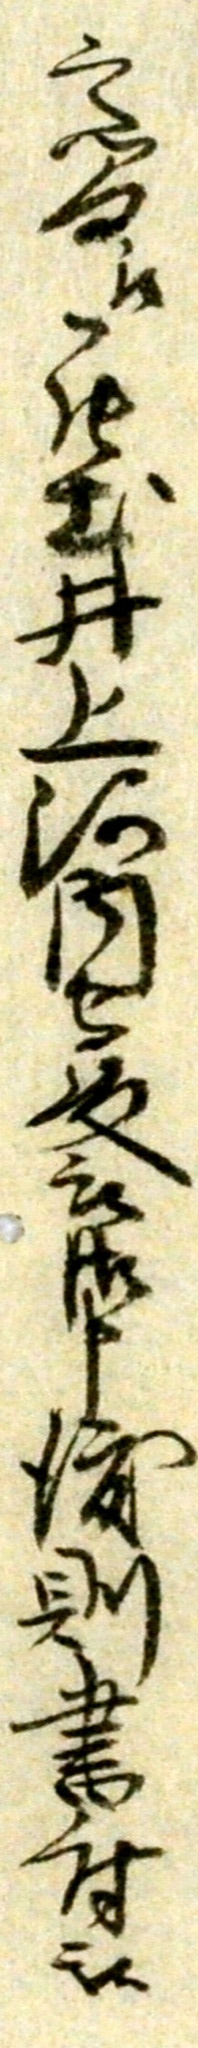間江罷出井上河内守殿被御申渡則書付被
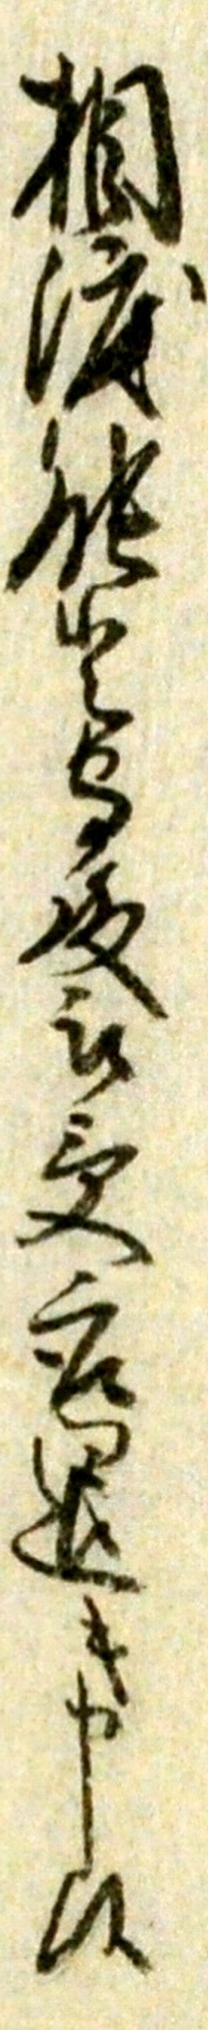相渡能登守殿被受取退キ申候
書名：日光御名代相勤候節ノ留
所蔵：伊那市立高遠町図書館・合同会社AMANE
